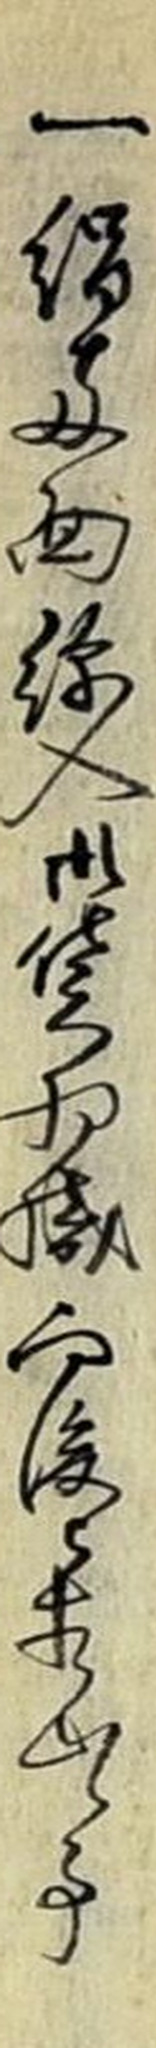一絹両面綿入御貸羽織向後被相止候事
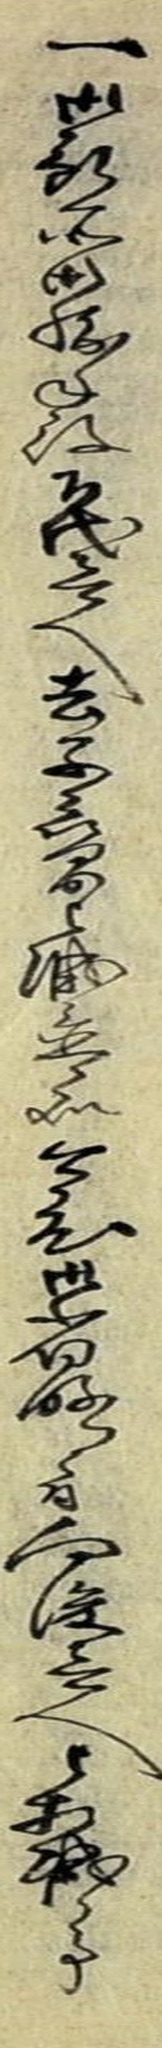一御預所御勝手役下代壱人去子暮ゟ被減置候処今度御省略ニ付向後壱人被相減候事
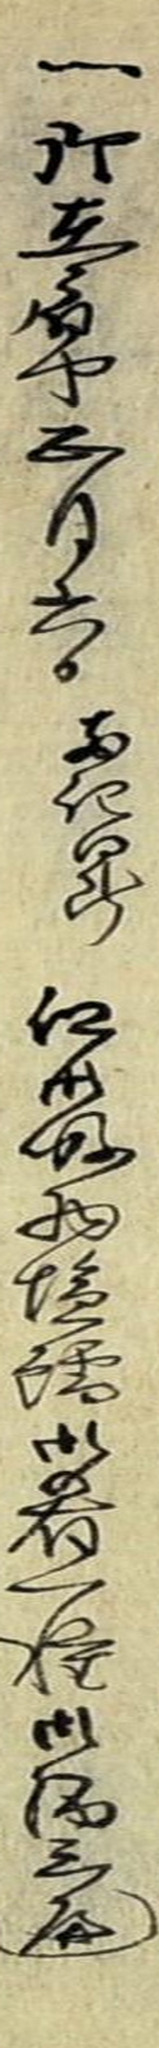一御在府中正月六日前記同断但御吸物塩鱈御肴一種御酒三遍
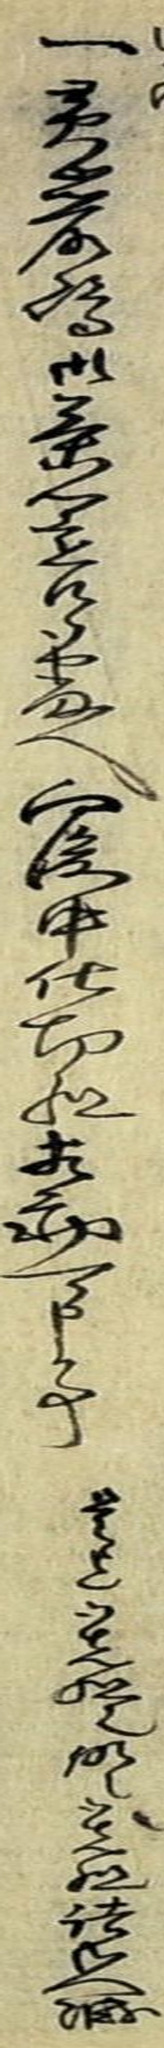一霊厳嶋御茶園口御番人向後中仕切組相勤可申事是迄御先組也明之御先組詰弐人減
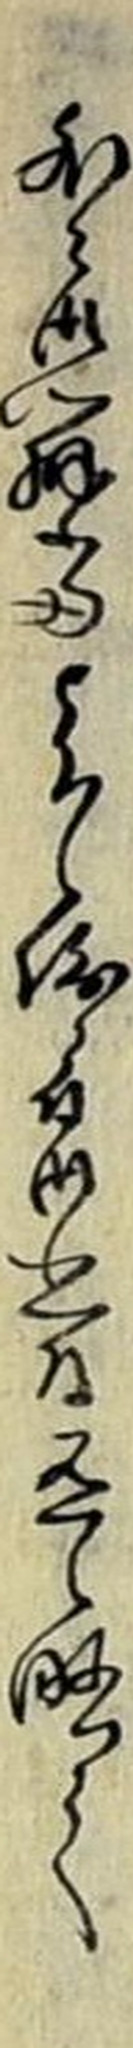外ニ御弁当被下候儀ニ付御書付有之略之
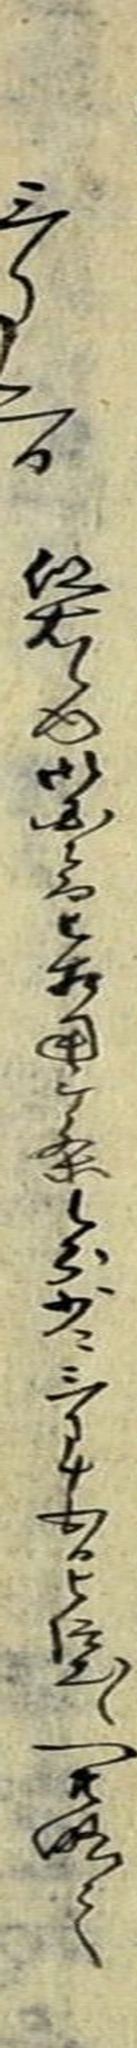三月二日但右之内御国ニ而被相用ケ条之分少々三月十五日被仰出候へ共略之
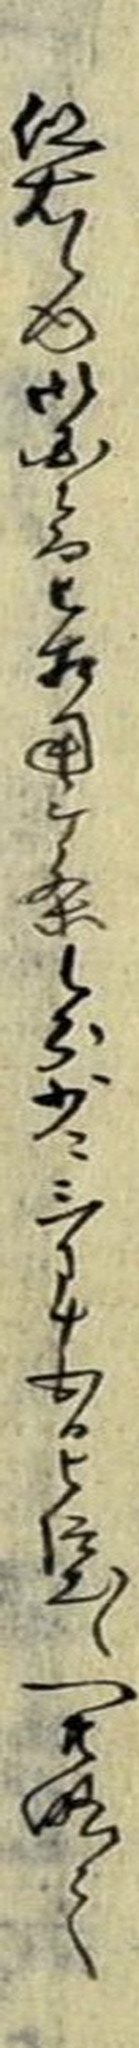三月二日但右之内御国ニ而被相用ケ条之分少々三月十五日被仰出候へ共略之
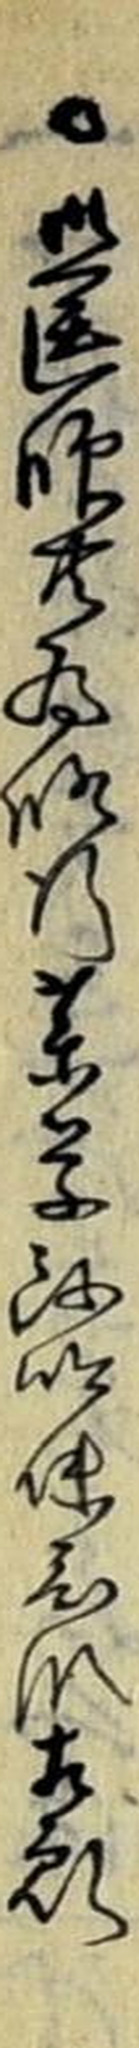〇御医師共為修行薬草致吟味度段相願
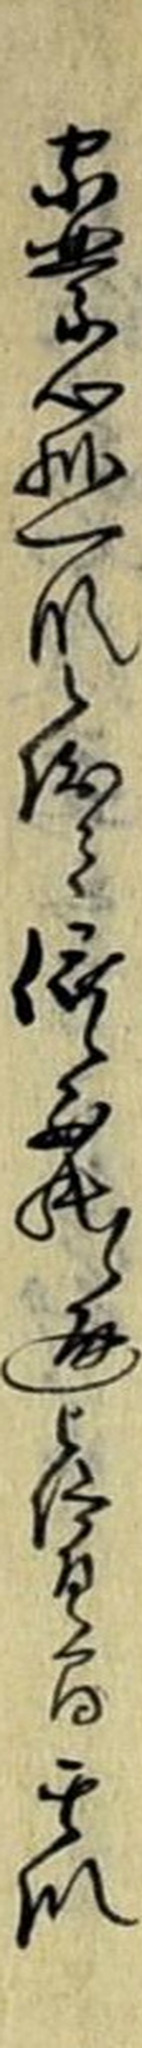家業心掛一段之儀ニ候依之別紙之通被仰付候間其段
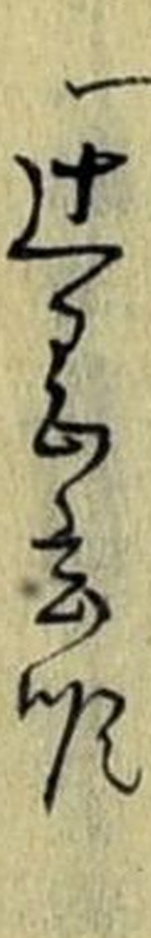辻岡玄順
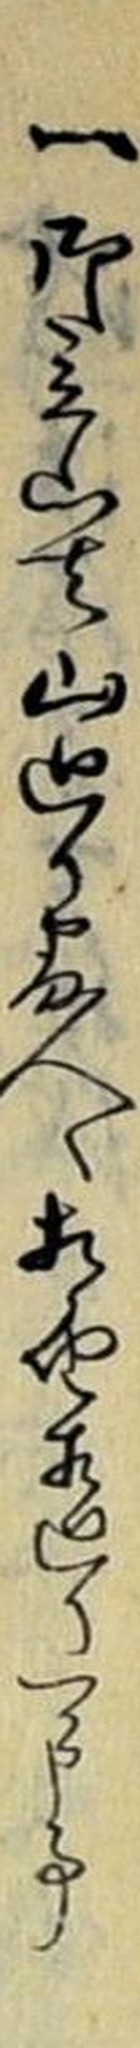一御立山者山廻り番人へ相届相廻り可申事
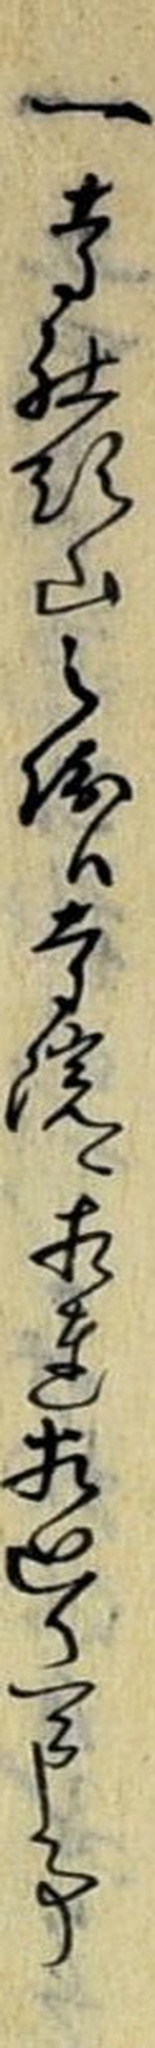一寺社領山之儀ハ寺院へ相達相廻り可申事
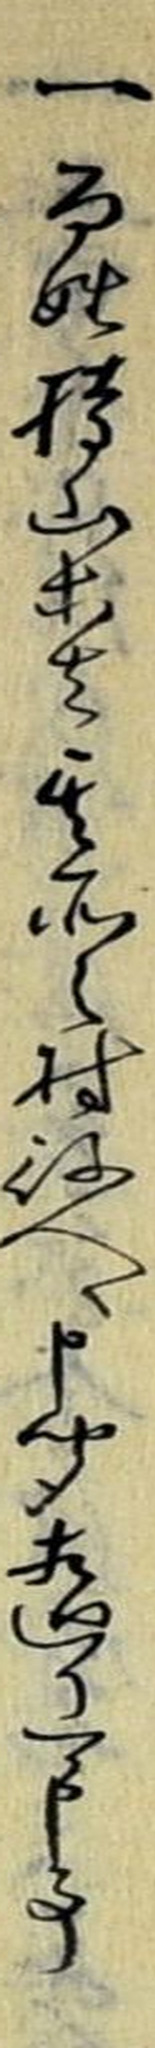一百姓持山等者其所之村役人へ申聞相廻り可申事
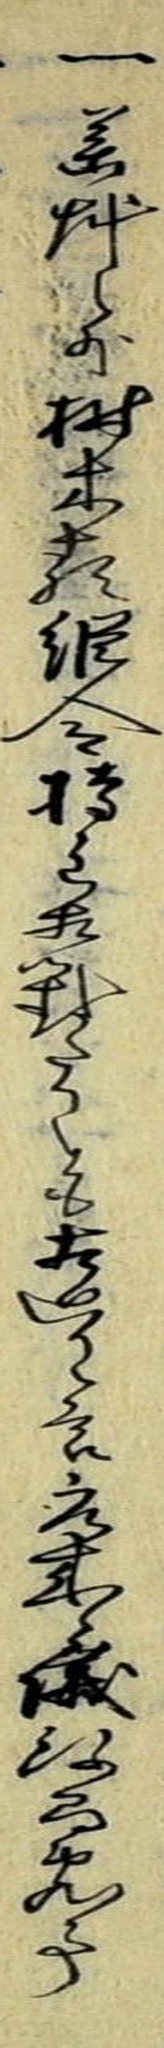一薬草之外樹木類縦令持主相対たりとも相廻り候節取来候儀致間敷事
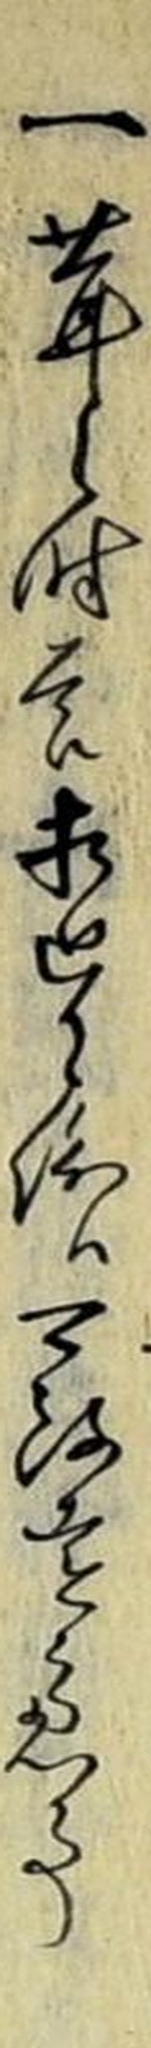一茸之時節相廻り候儀ハ可致遠慮事
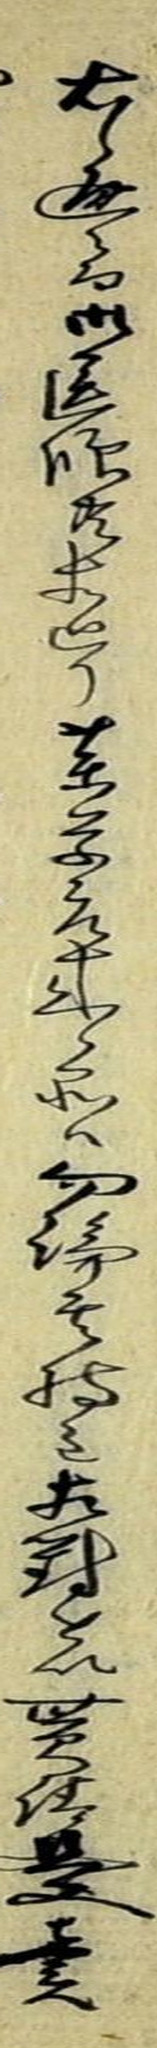右之通ニ而御医師共相廻り薬草取来候品ハ勿論其持主相対を以貰請且又売
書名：命令之部 三
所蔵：福井県文書館 Fukui Prefectural Archives
